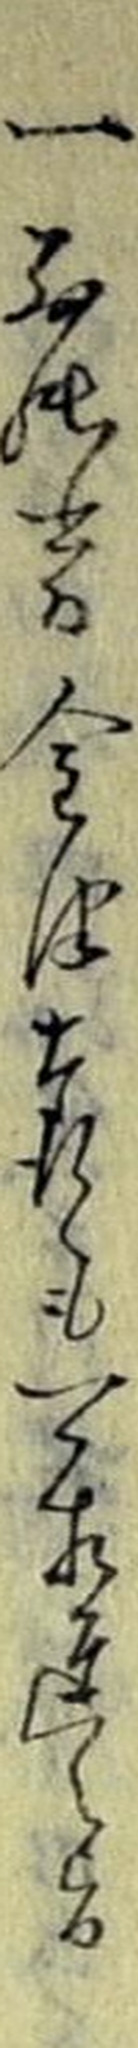一別紙書付金津奉行へも可相達之旨
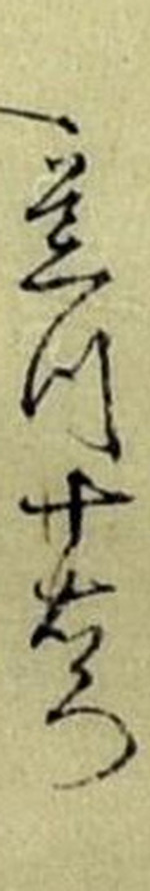荒川十右衛門
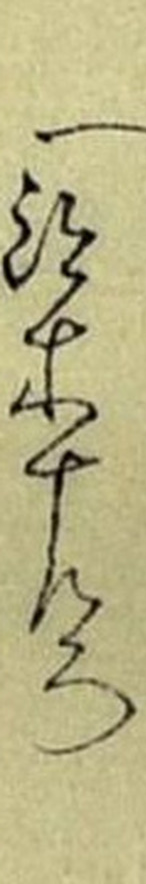鈴木十左衛門
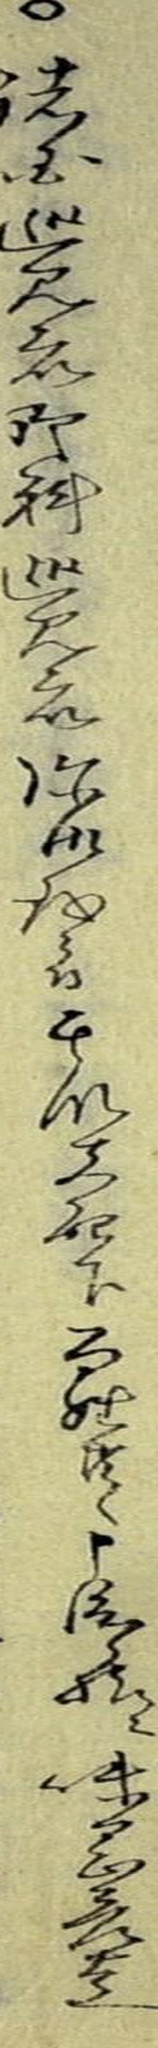〇諸国御巡見衆御料巡見衆弥御越ニ付其段支配下百姓共へ申渡候様ニ味岡彦大夫
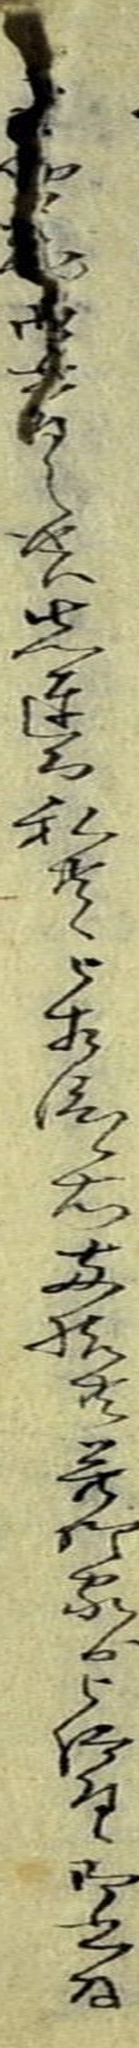御書付之儀ハ先達而私共へ被相渡候右両様共并御家ゟ被仰付候御書付
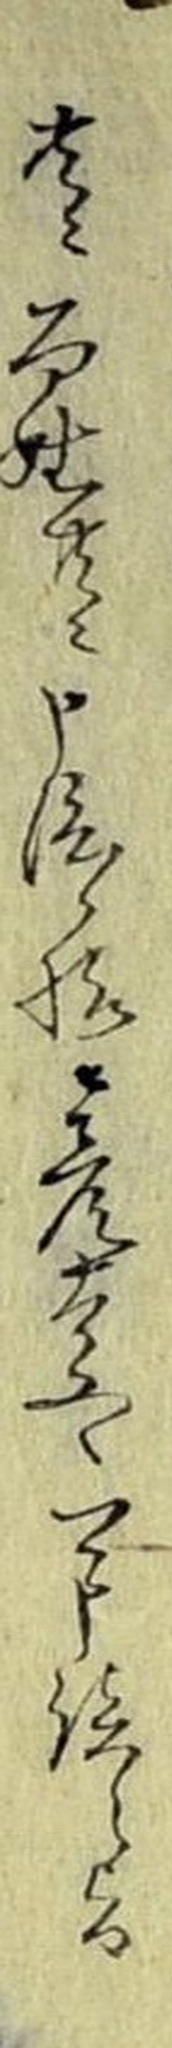共ニ百姓共ニ申渡候様ニ彦大夫へ可申談之旨
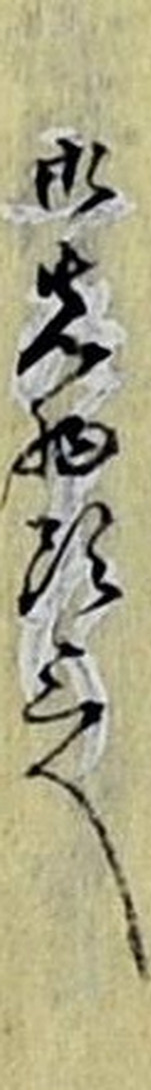御先物頭三人
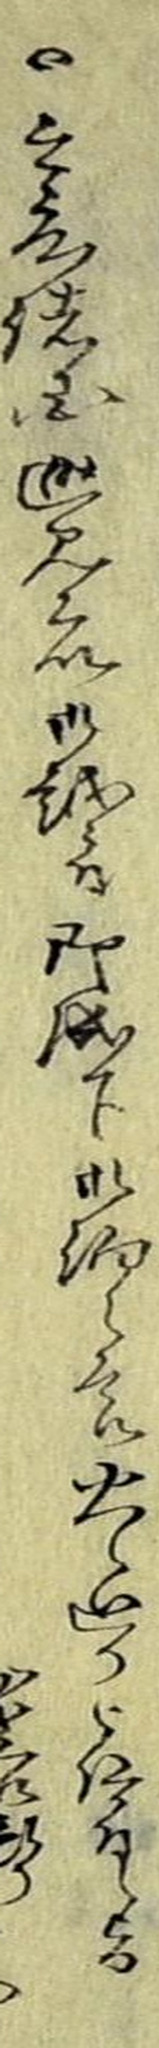〇今度諸国巡見衆御越ニ付御城下御泊之節火之廻り被仰付候旨
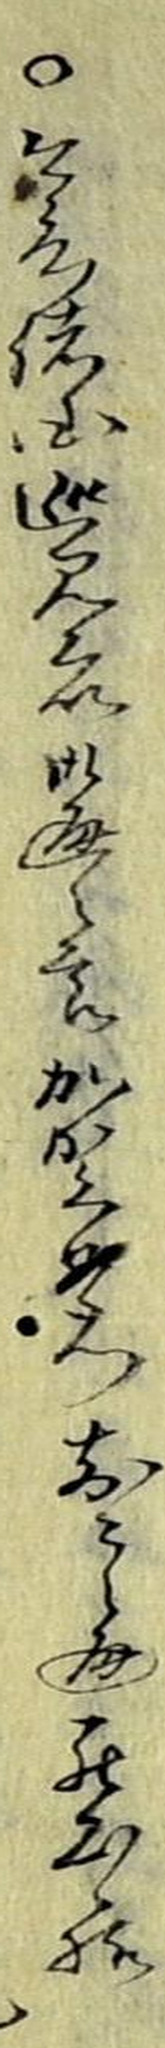〇今度諸国巡見衆御通之節加賀口御門前々之通罷出候様
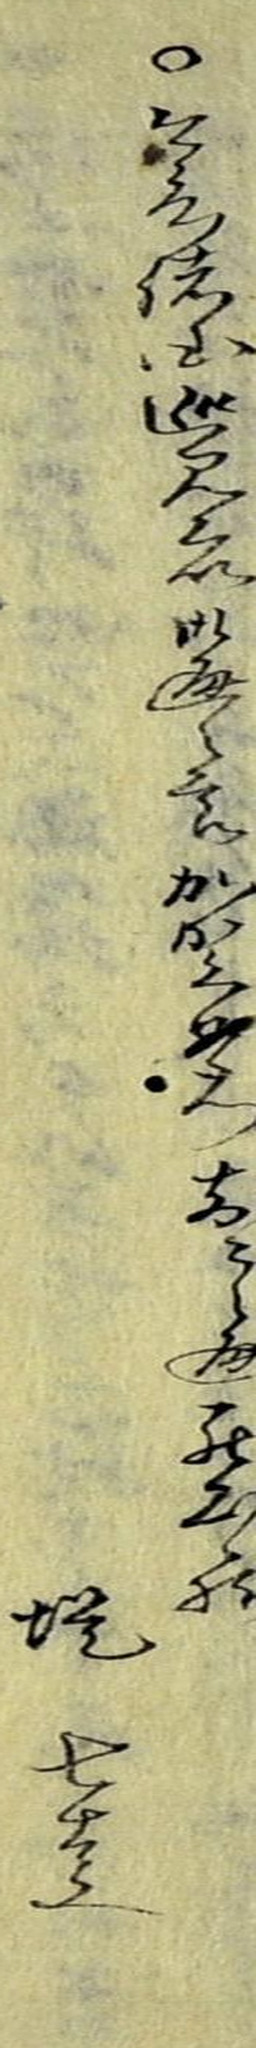堤七大夫
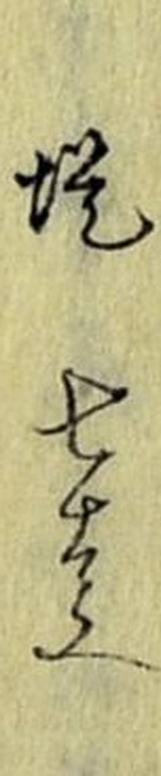堤七大夫
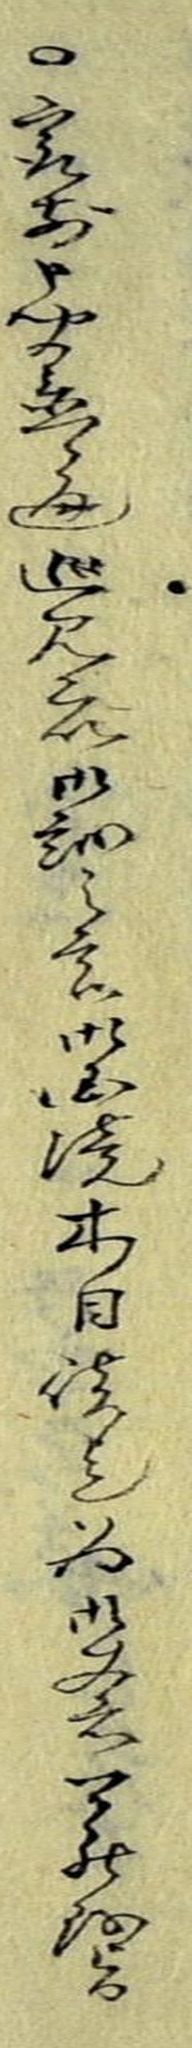〇最前申聞置候通巡見衆御越之節御国境木目峠迄為御使者可罷越旨

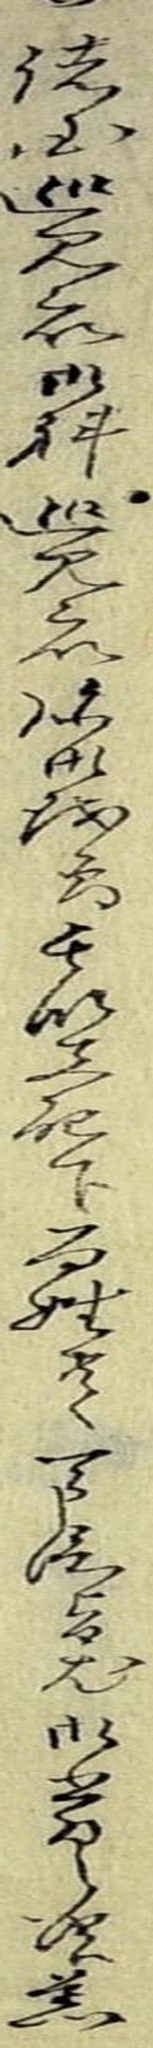〇諸国御巡見衆御料巡見衆弥御越候間其段支配下百姓共へ可申渡旨尤御書付之儀ハ荒
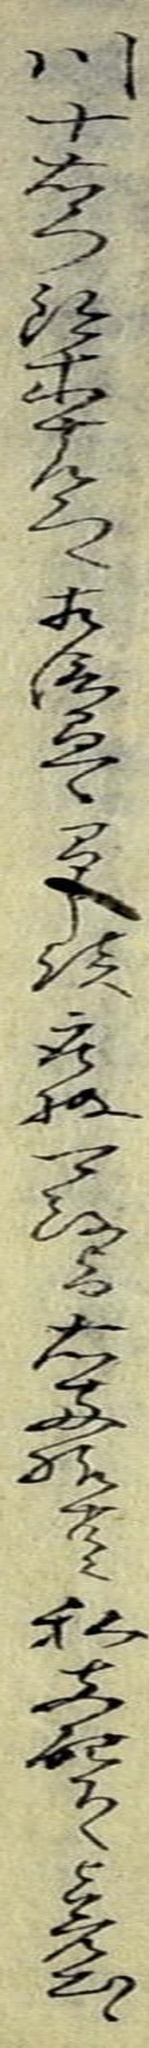川十右衛門鈴木十左衛門へ相渡置候間申談取扱可致旨右両様共ニ私支配下へ被差出候
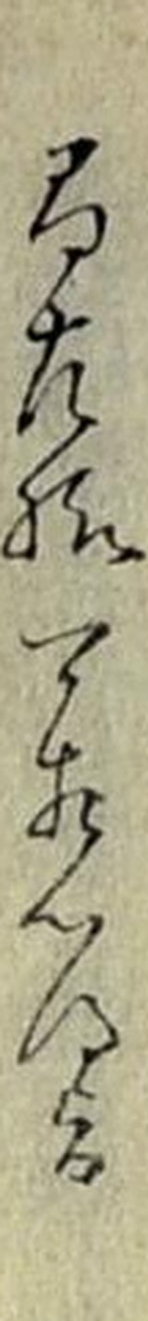間左様可相心得旨
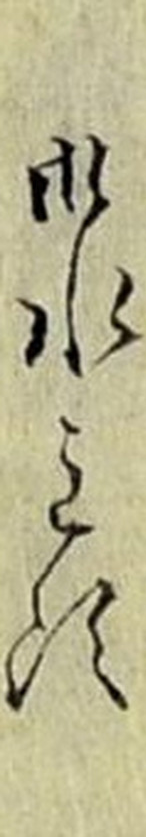御水主頭
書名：命令之部 一
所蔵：福井県文書館 Fukui Prefectural Archives
